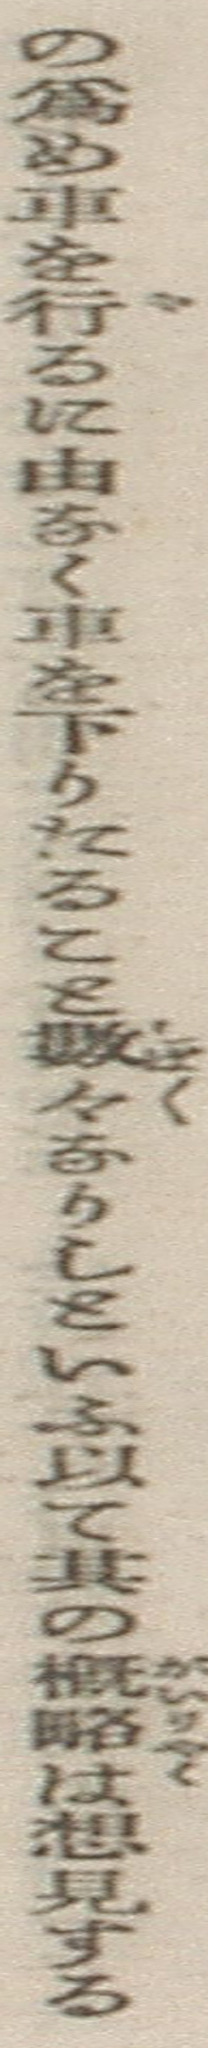の為め車を行るに由なく車を下りたること数々なりしといふ以て其の概略は想見する
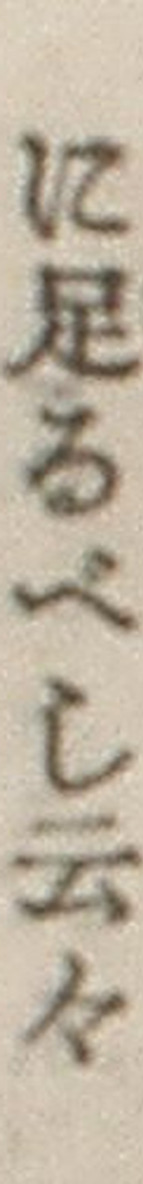に足るべし云々
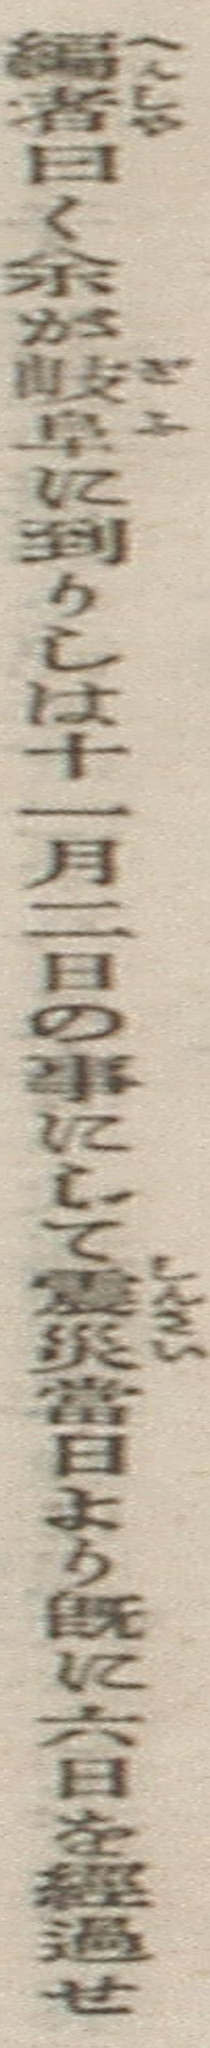編者曰く余が岐阜に到りしは十一月二日の事にして震災当日より既に六日を経過せ
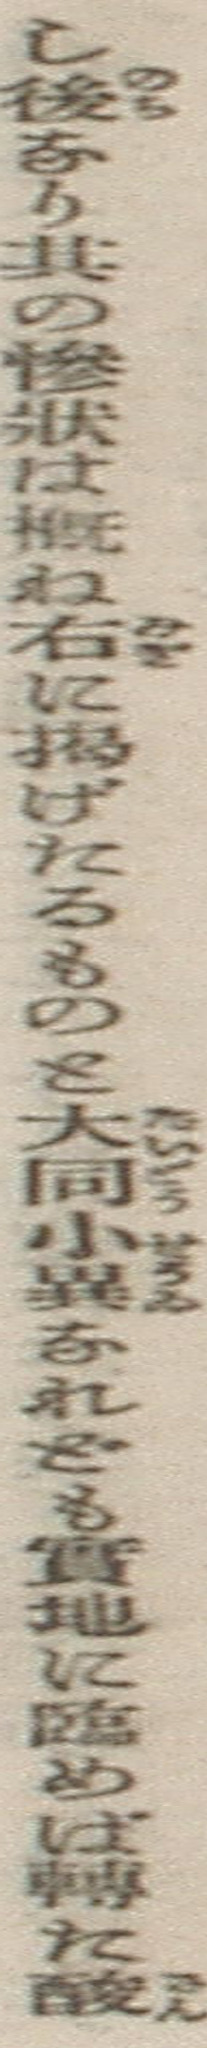し後なり其の惨状は概ね右に掲げたるものと大同小異なれども実地に臨めば転た酸

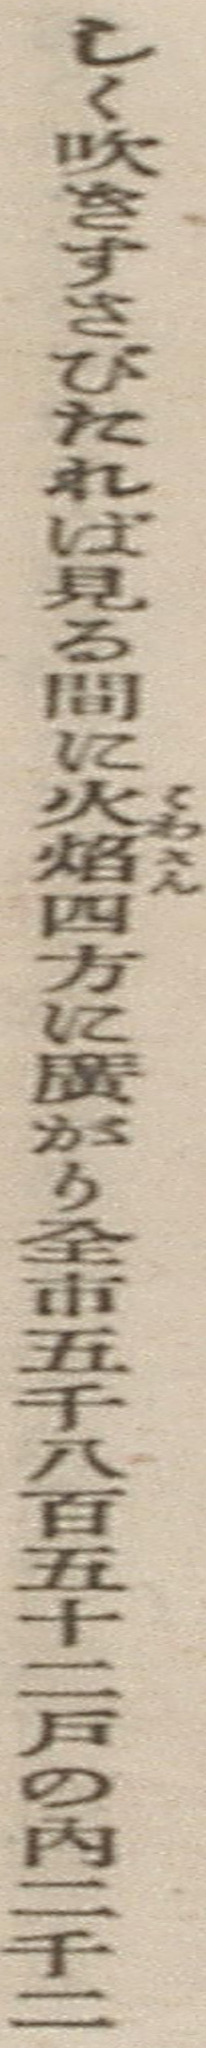しく吹きすさびたれば見る間に火焔くわえん四方に広がり全市五千八百五十二戸の内二千二
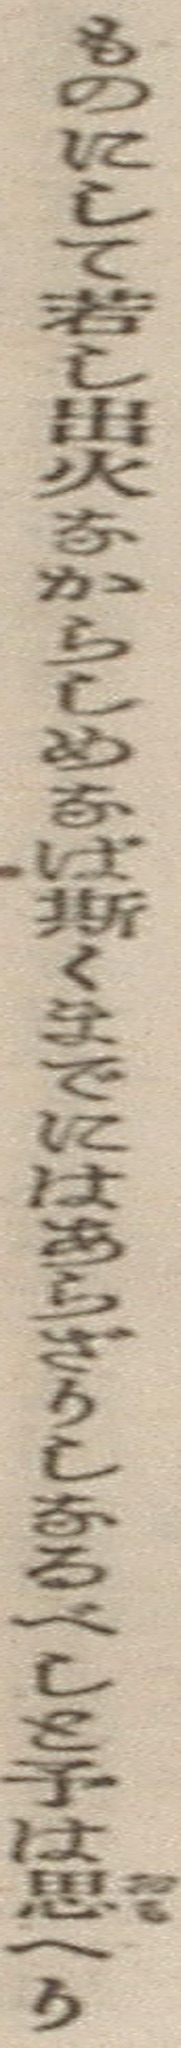ものにして若し出火なからしめなば斯くまでにはあらざりしなるべしと予は思おもへり
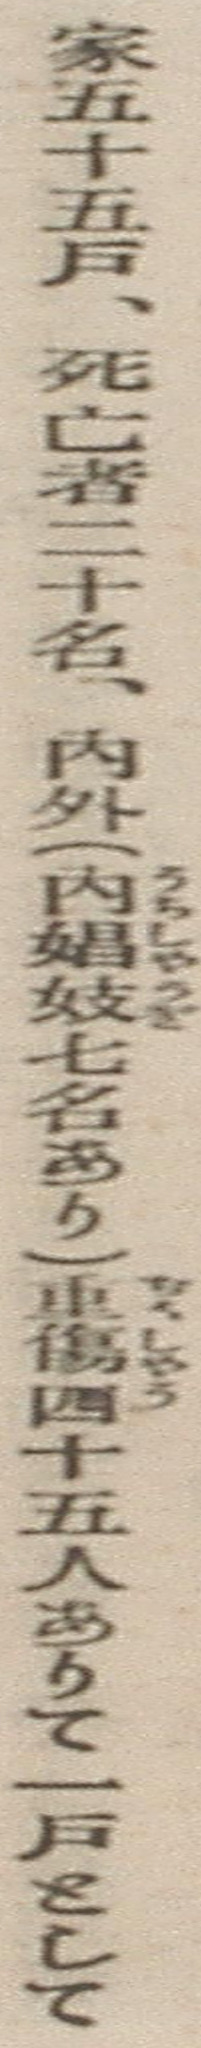家五十五戸、死亡者二十名、内外重傷ぢうしやう四十五人ありて一戸として

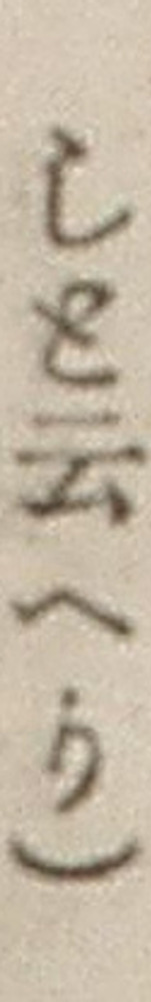しと云へり）
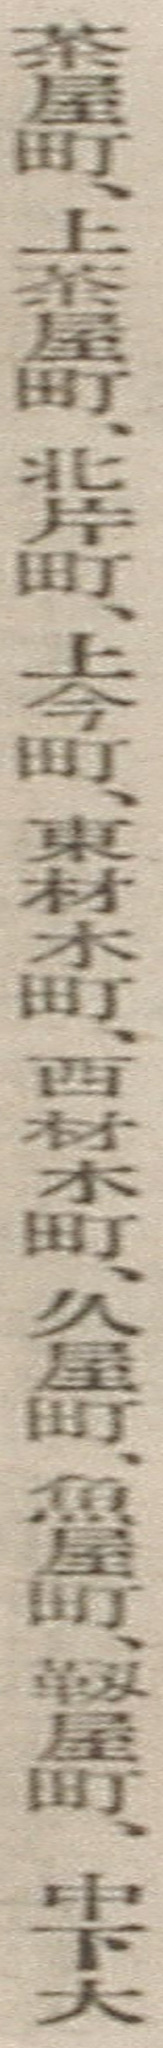茶屋町、上茶屋町、北片町、上今町、東材木町、西材木町、久屋町、魚屋町、靱屋町、中下大
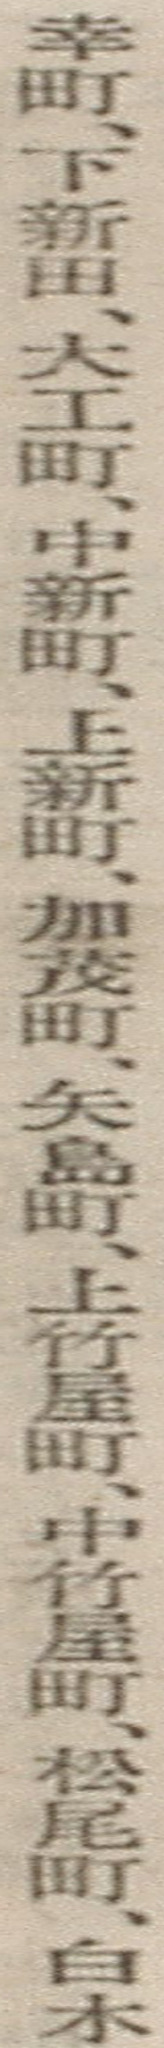幸町、下新町、大工町、中新町、上新町、加茂町、矢島町、上竹屋町、中竹屋町、松尾町、白木
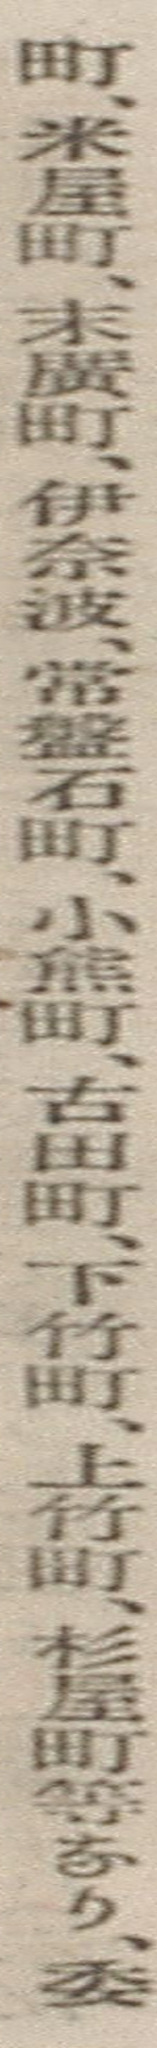町、米屋町、末広町、伊奈波、常盤石町、小熊町、古田町、下竹町、上竹町、杉屋町等なり、委くは

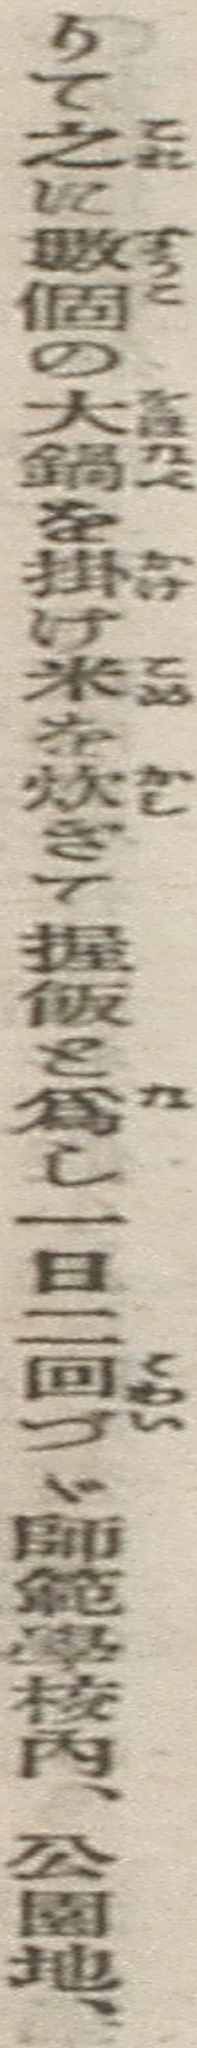りて之に数個の大鍋を掛け米を炊ぎて握飯と為し一日二回づゞ師範学校内、公園地、
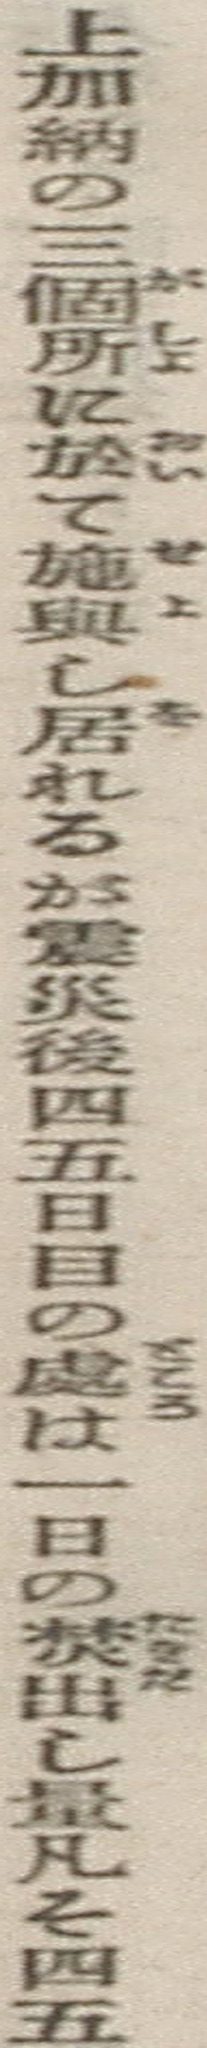上加納の三個所に於て施与し居れるが震災後四五日目の処は一日の焚出し量凡そ四五
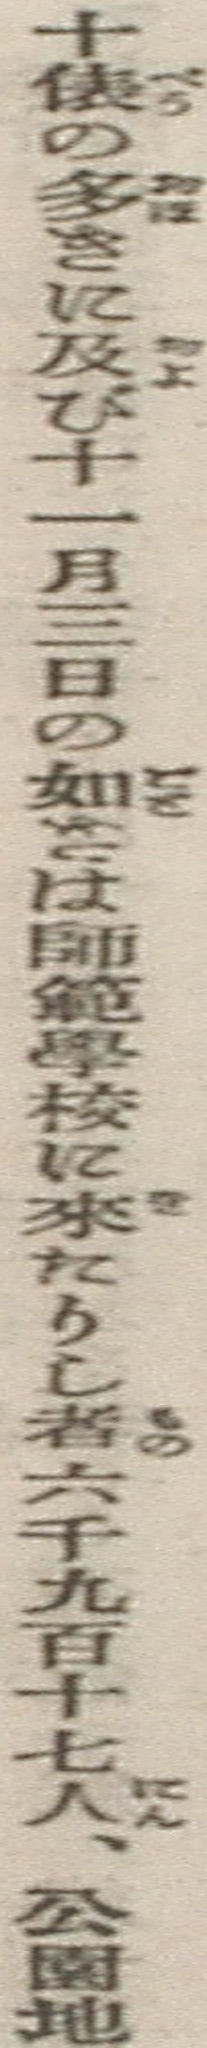十俵の多きに及び十一月三日の如きは師範学校に来たりし者六千九百十七人、公園地
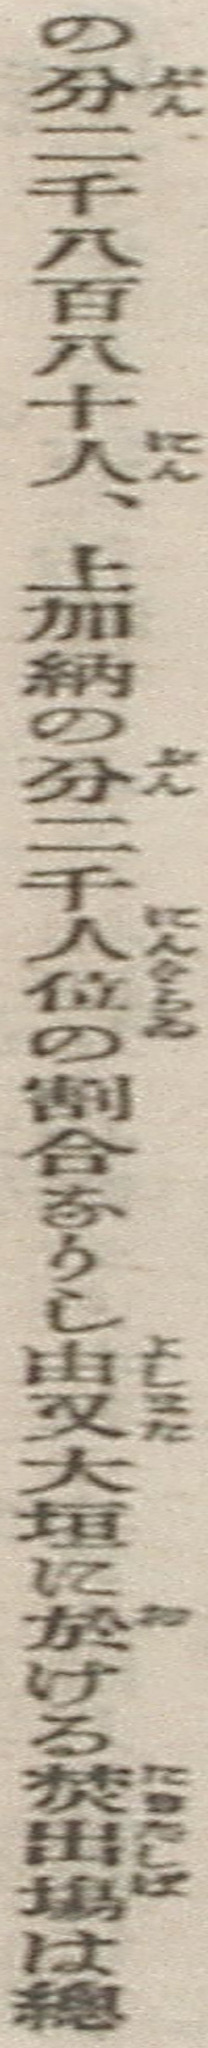の分二千八百八十人、上加納の分二千人位の割合なりし由又大垣に於ける焚出場は総
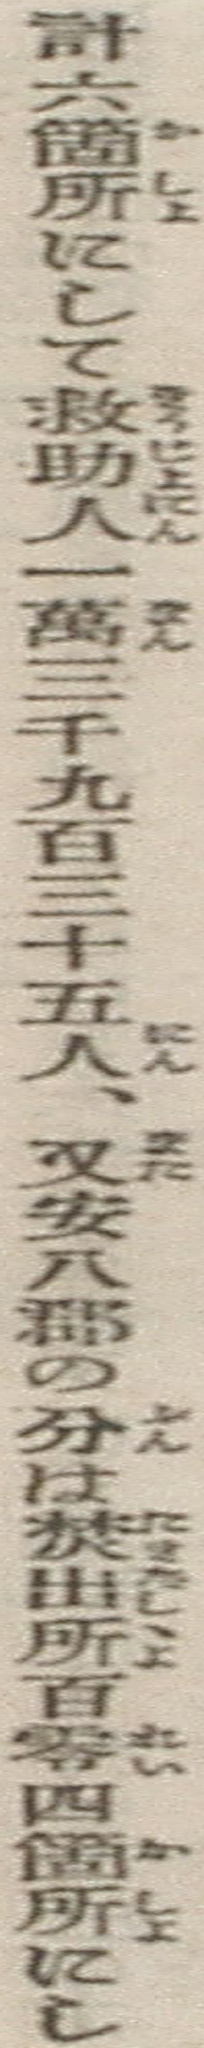計六箇所にして救助人一万三千九百三十五人、又安八郡の分は焚出所百零四箇所にし
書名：愛知岐阜福井三県　大地震見聞録（内題）
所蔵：東京大学地震研究所図書室 Earthquake Research Institute Library, The University of Tokyo, JAPAN
